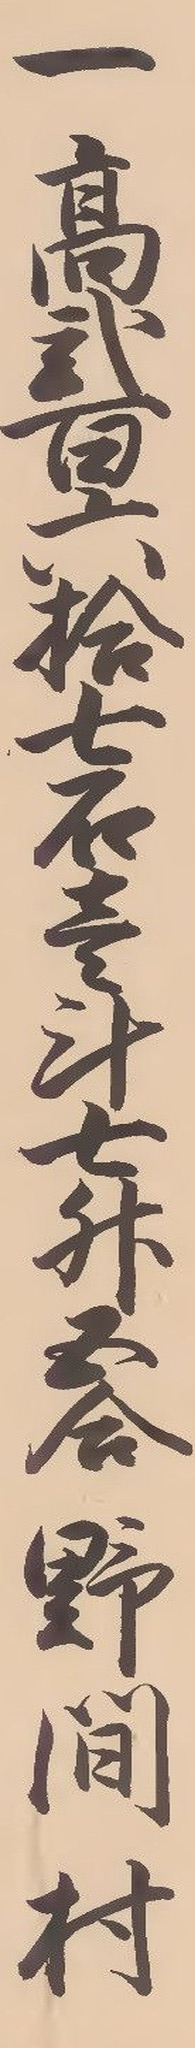一髙弐百六拾七石壱斗七升五合野間村
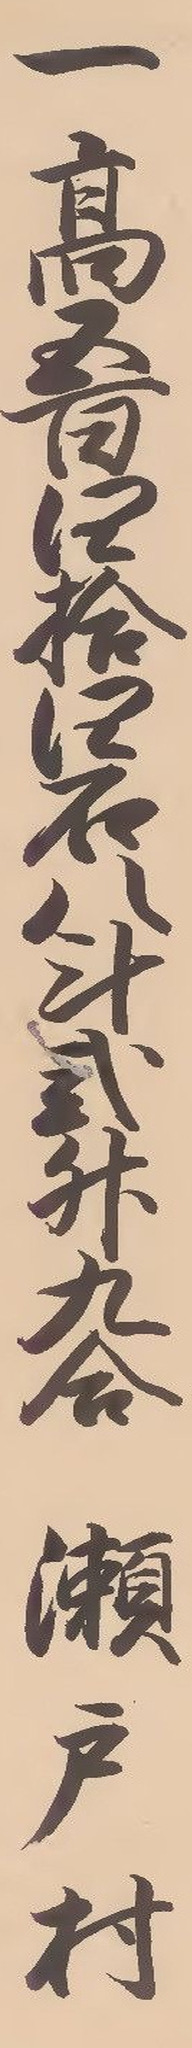一髙五百四拾四石八斗弐升九合瀬戸村

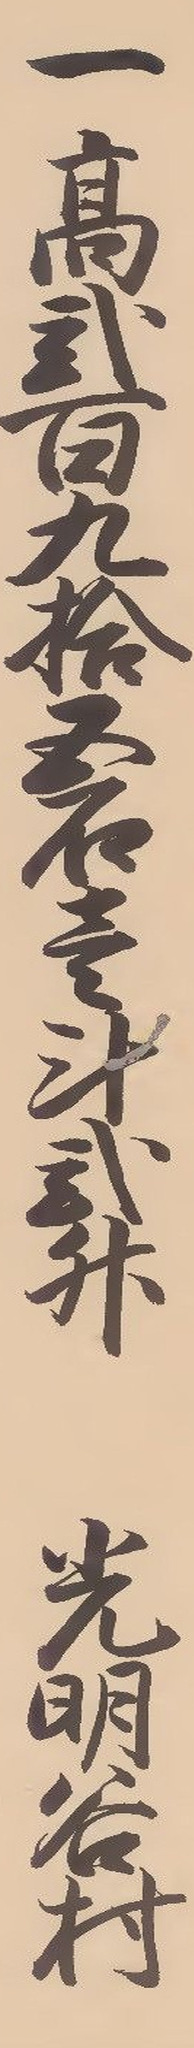一髙弐百九拾五石壱斗弐升光明谷村
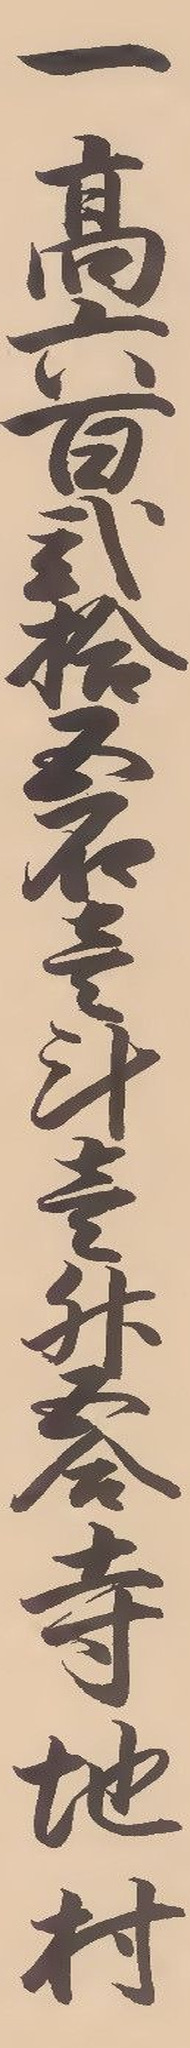一髙六百弐拾五石壱斗壱升五合寺地村
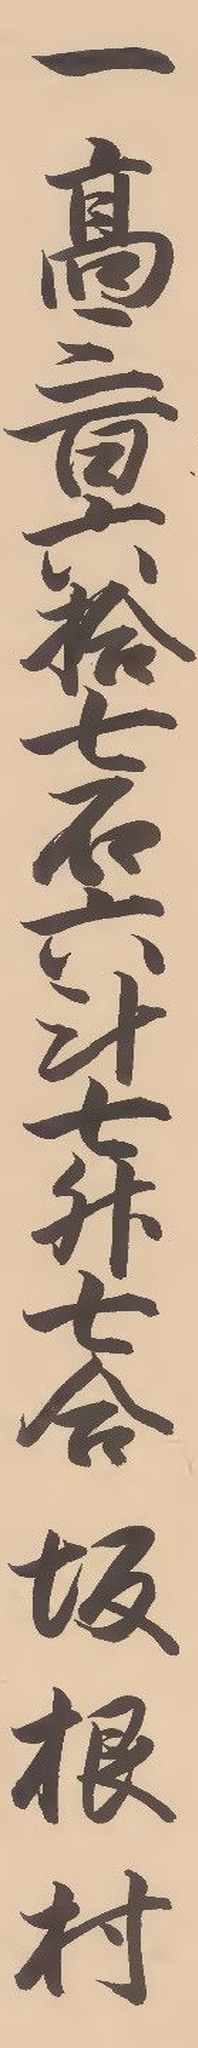一髙三百六拾七石六斗七升七合坂根村
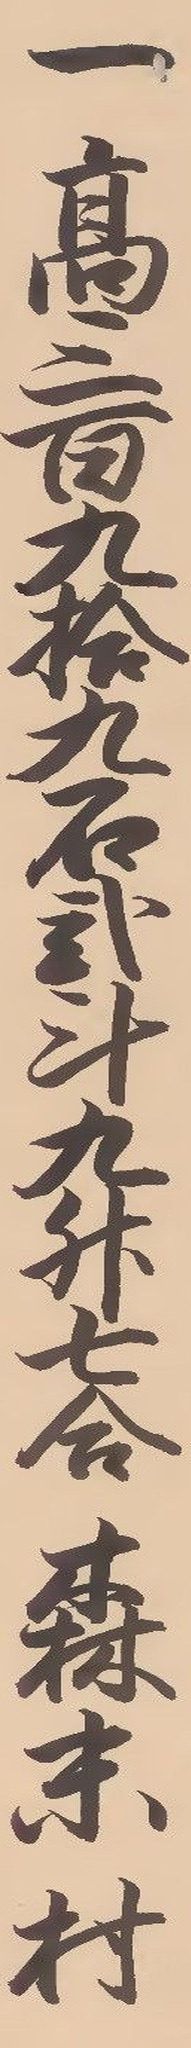一髙三百九拾九石弐斗九升七合森末村
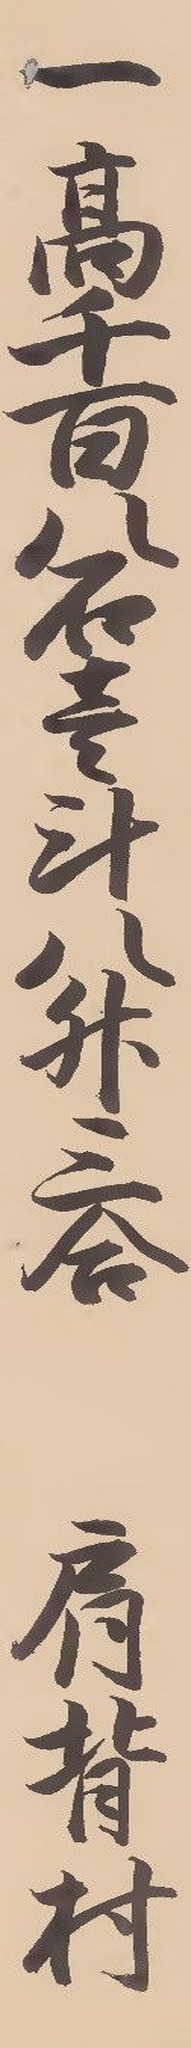一髙千百八石壱斗八升三合肩背村
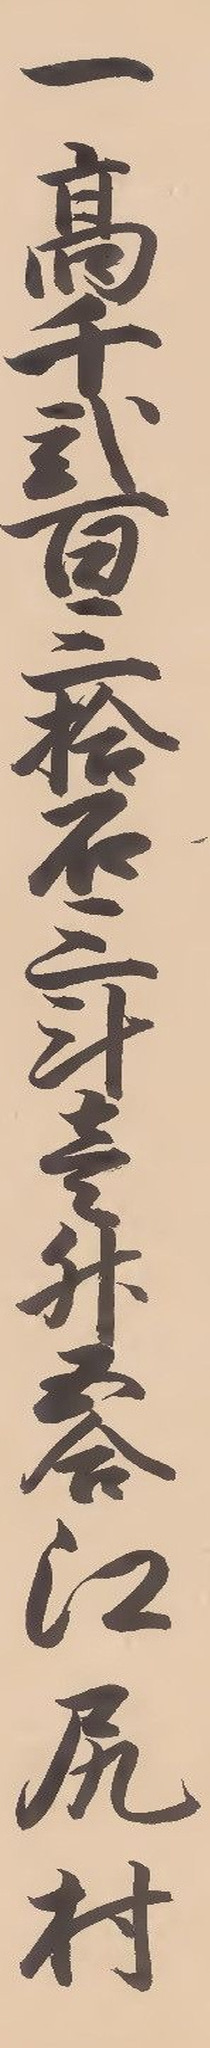一髙千弐百三拾石三斗壱升五合江尻村
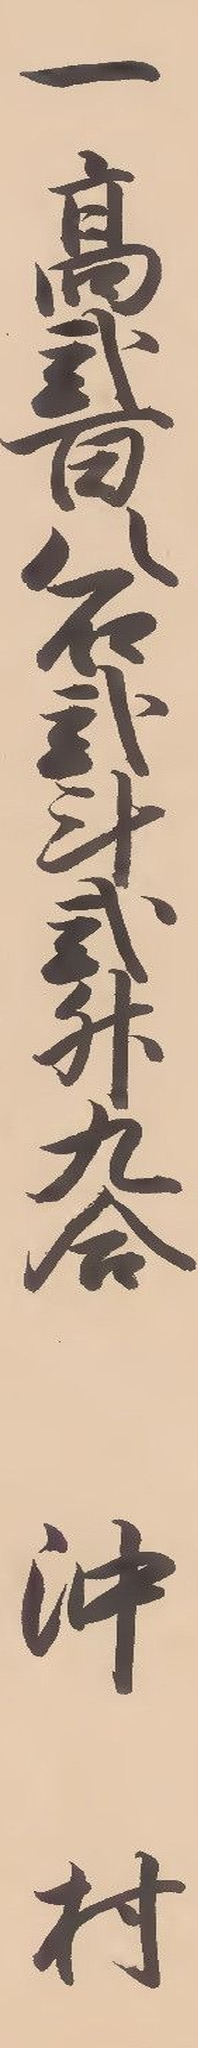一髙弐百八石弐斗弐升九合沖村
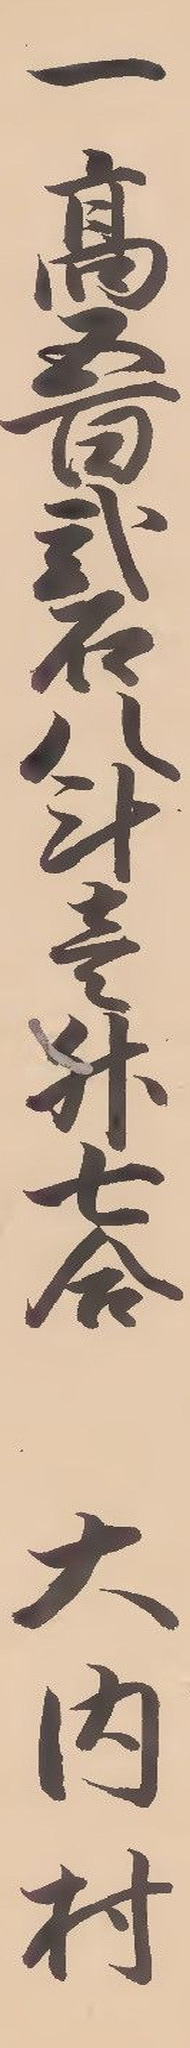一髙五百弐石八斗壱升七合大内村

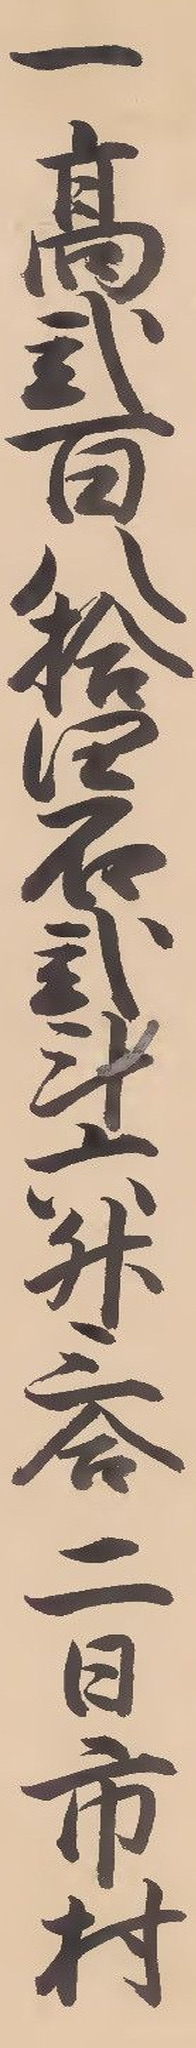一髙弐百八拾四石弐斗六升三合二日市村
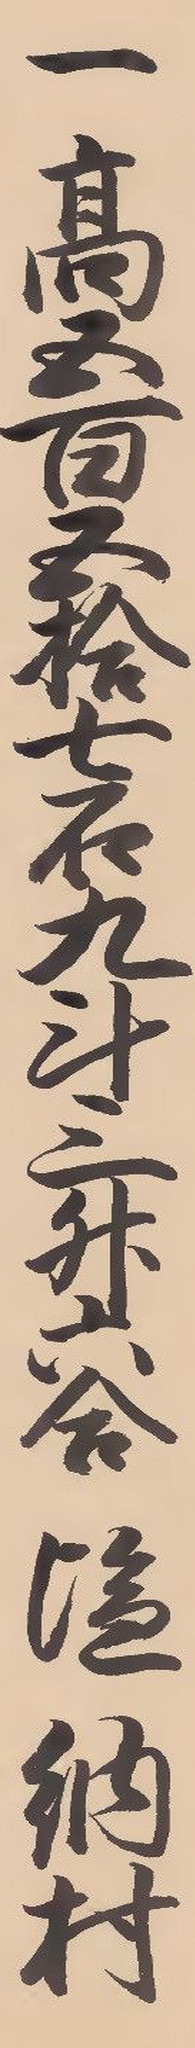一髙五百五拾七石九斗三升六合塩納村
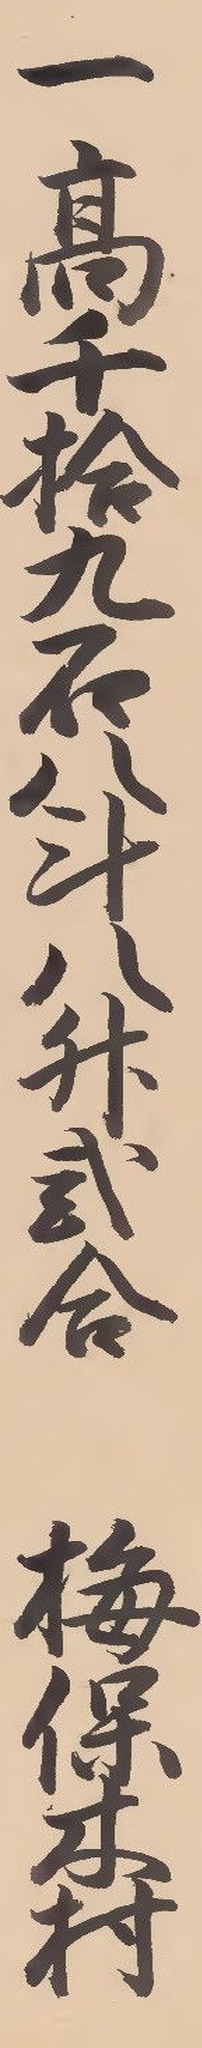一髙千拾九石八斗八升弐合梅保木村
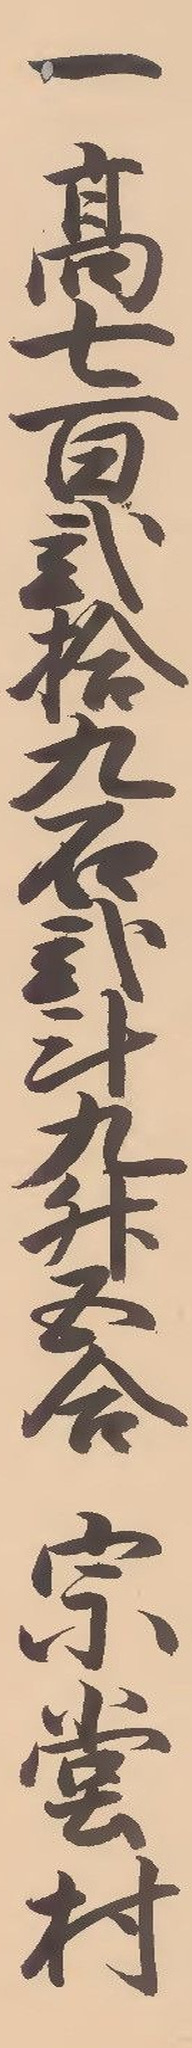一髙七百弐拾九石弐斗九升五合宗堂村
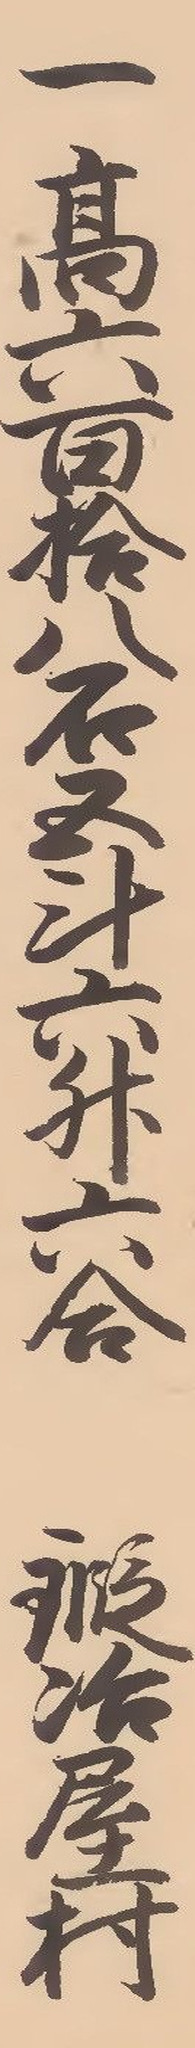一髙六百拾八石五斗六升六合鍛冶屋村
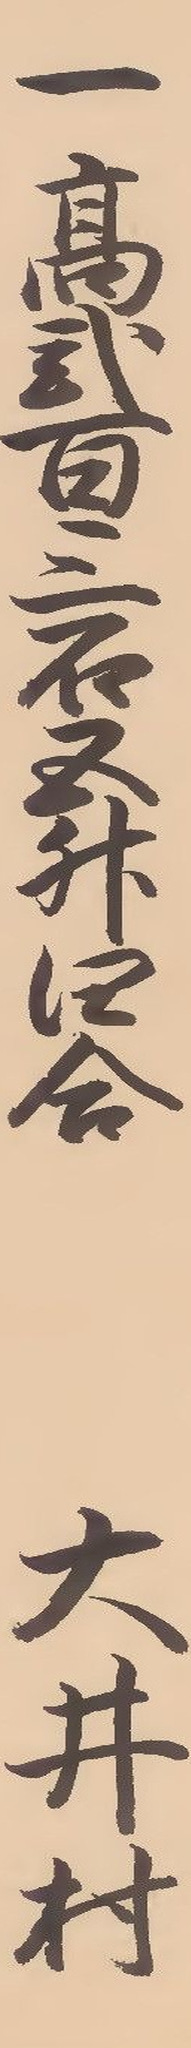一髙弐百三石五升四合大井村
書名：備前国郷帳
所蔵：国立公文書館 National Archives of Japan
